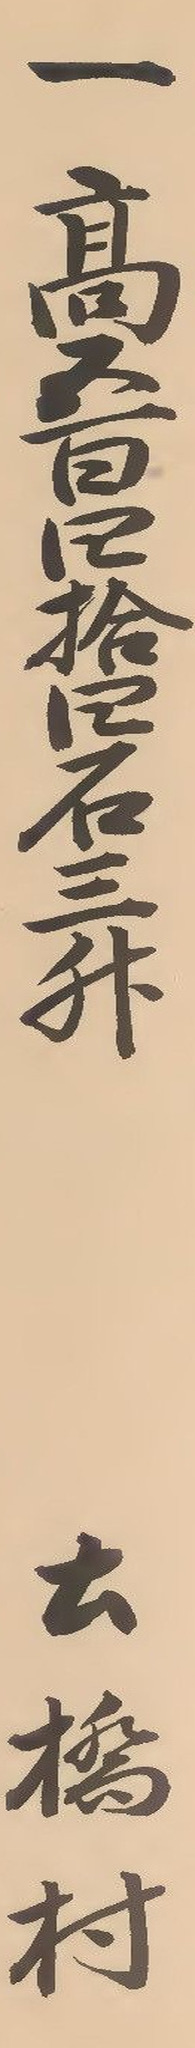一高五百四拾四石三升土橋村
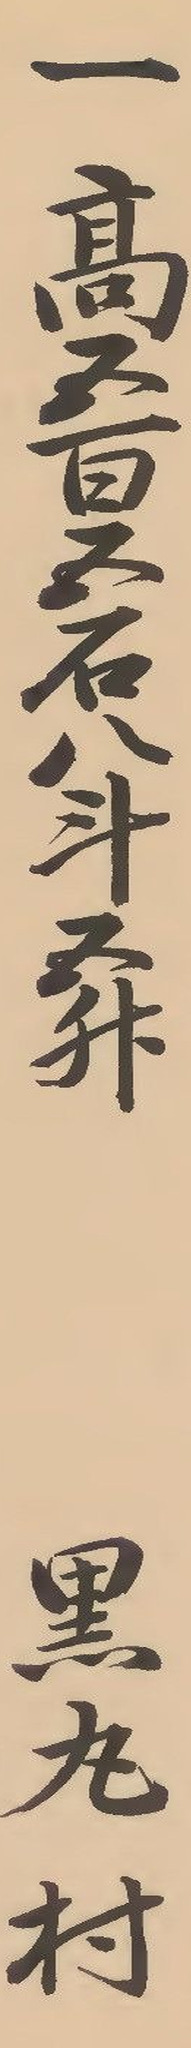一高五百五石八斗五升黒丸村
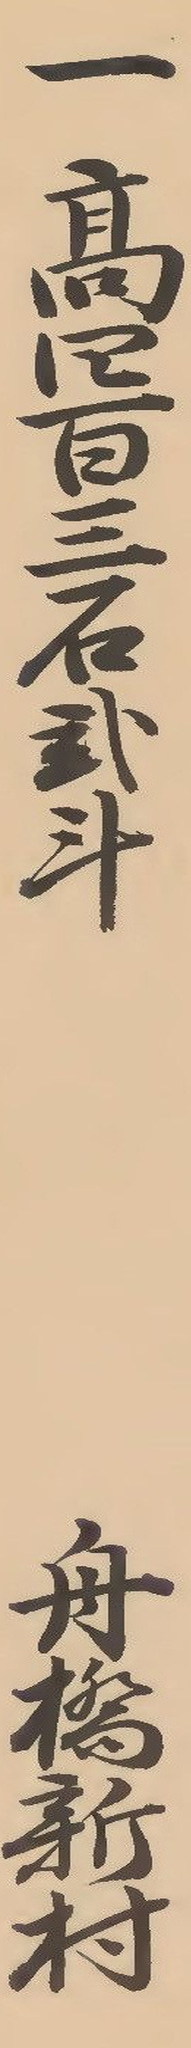一高四百三石弐斗舟橋新村

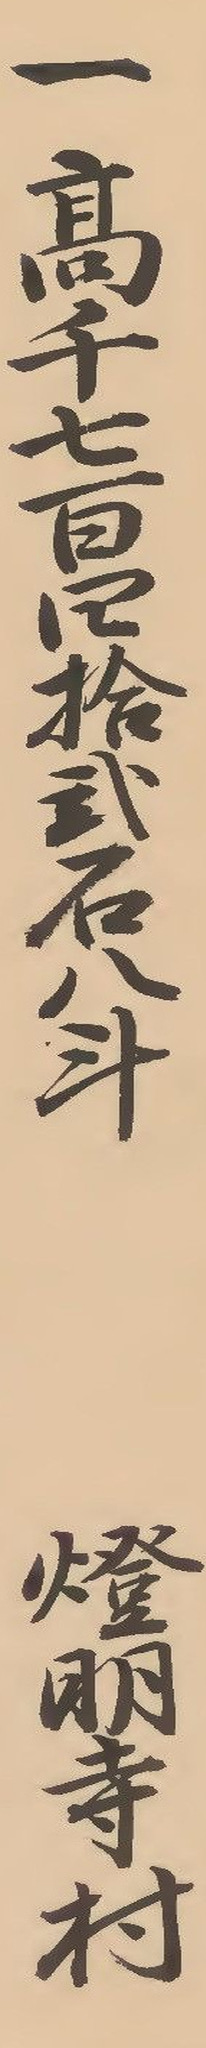一高千七百四拾弐石八斗灯明寺村
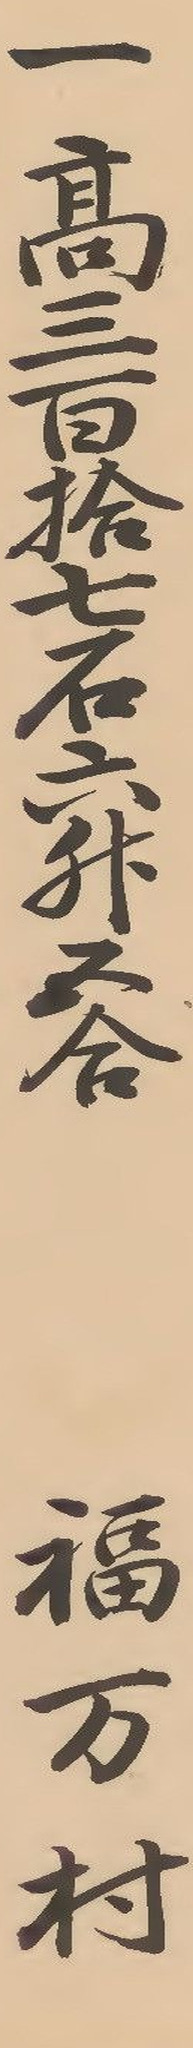一高三百拾七石六升五合福万村
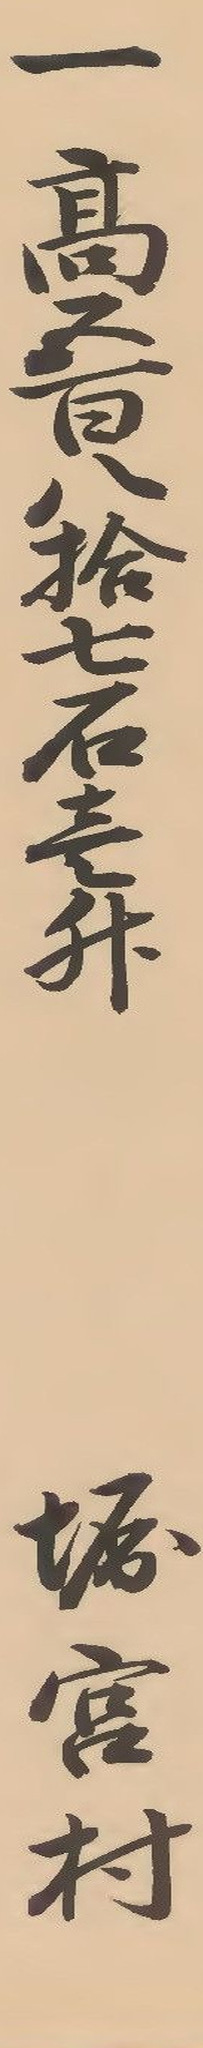一高五百八拾七石壱升堀宮村
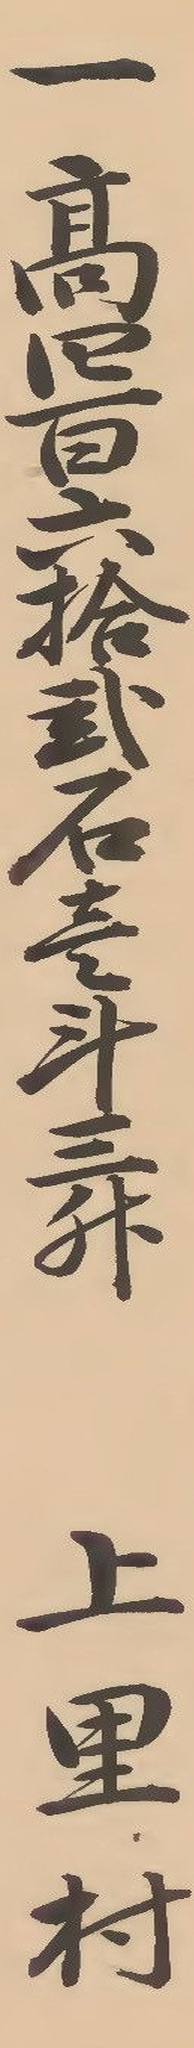一高四百六拾弐石壱斗三升上里村
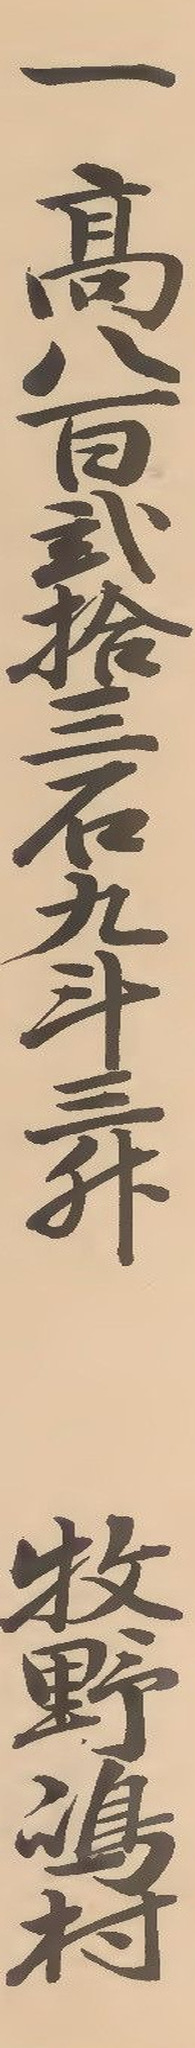一高八百弐拾三石九斗三升牧野島村
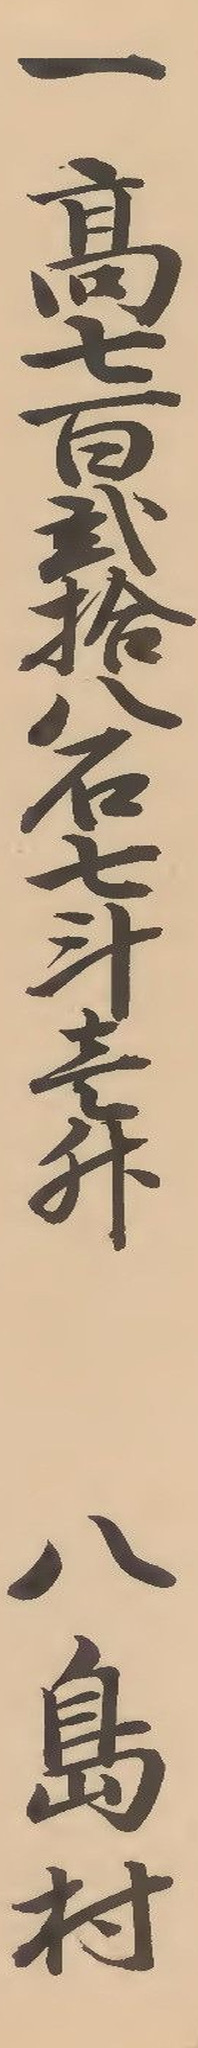一高七百弐拾八石七斗壱升八島村
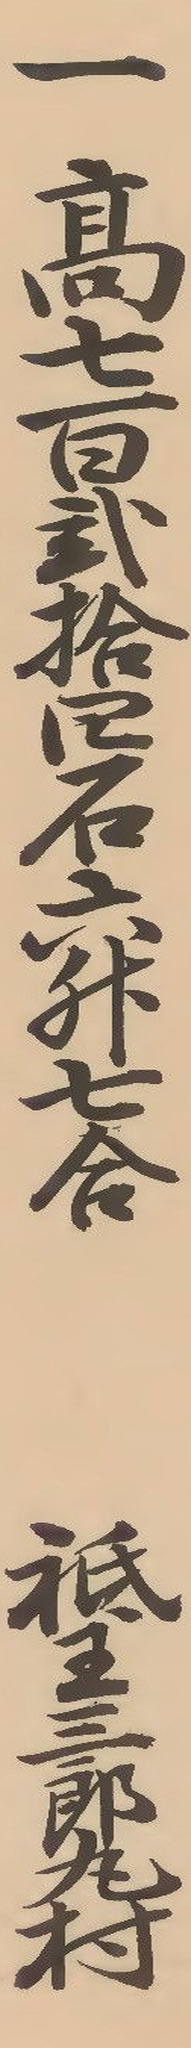一高七百弐拾四石六升七合祇王三郎丸村
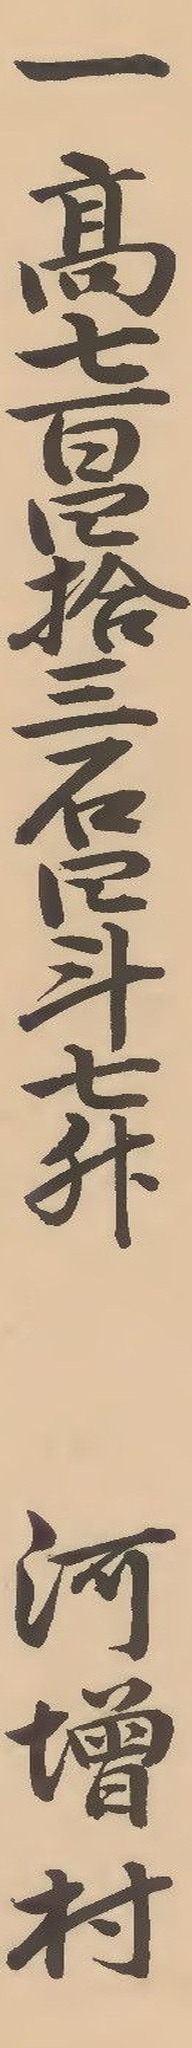一高七百四拾三石四斗七升河増村

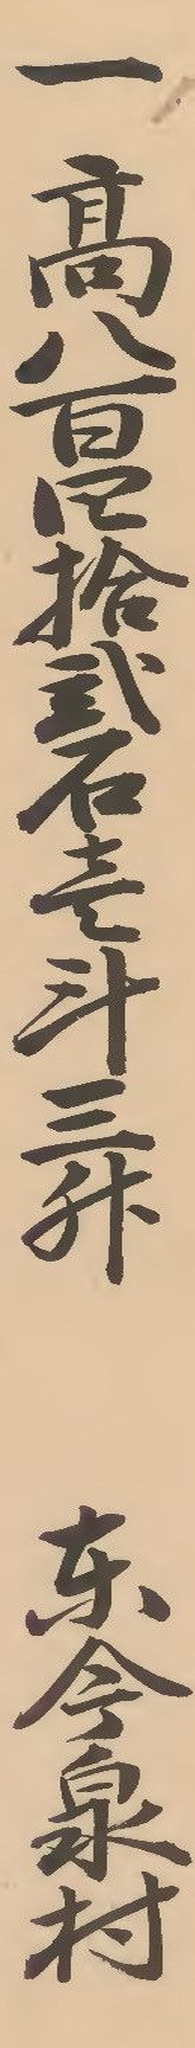一高八百四拾弐石壱斗三升東今泉村
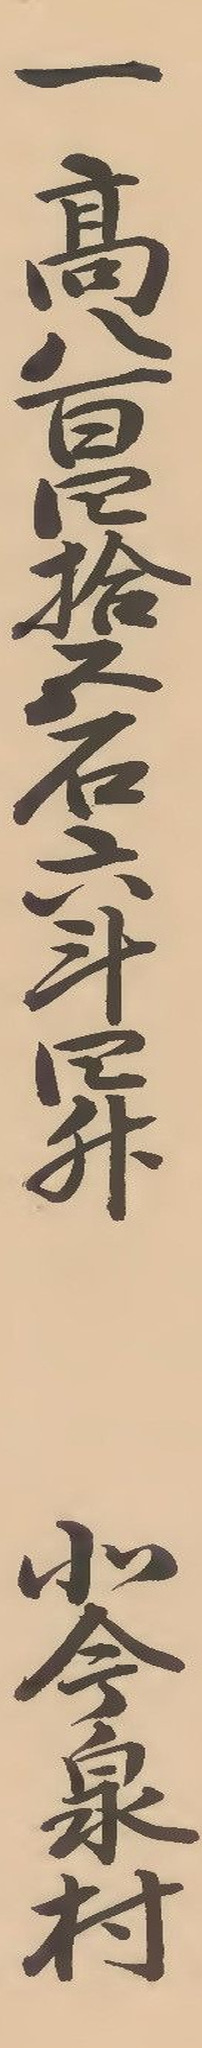一高八百四拾五石六斗四升北今泉村
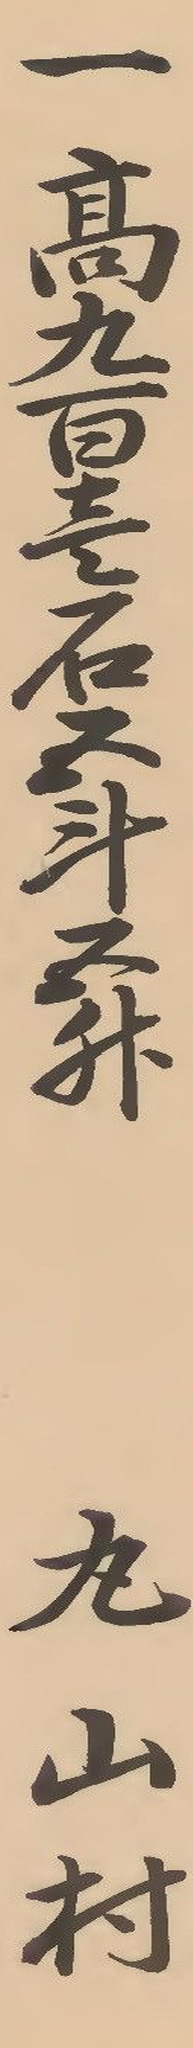一高九百壱石五斗五升丸山村
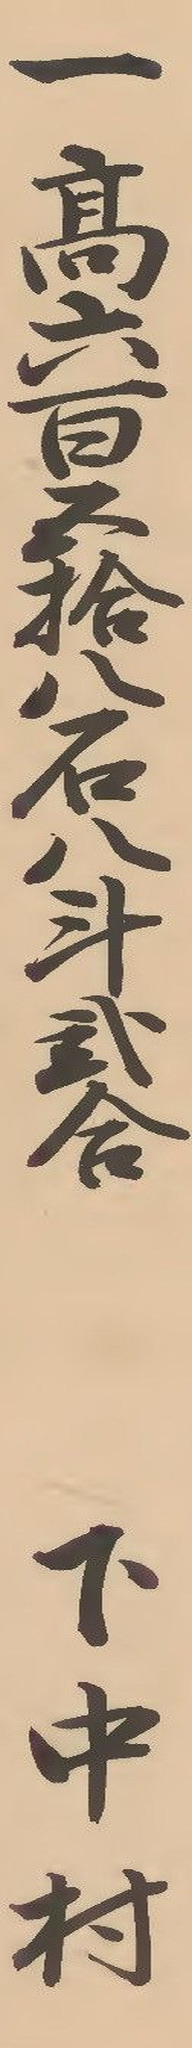一高六百五拾八石八斗弐合下中村
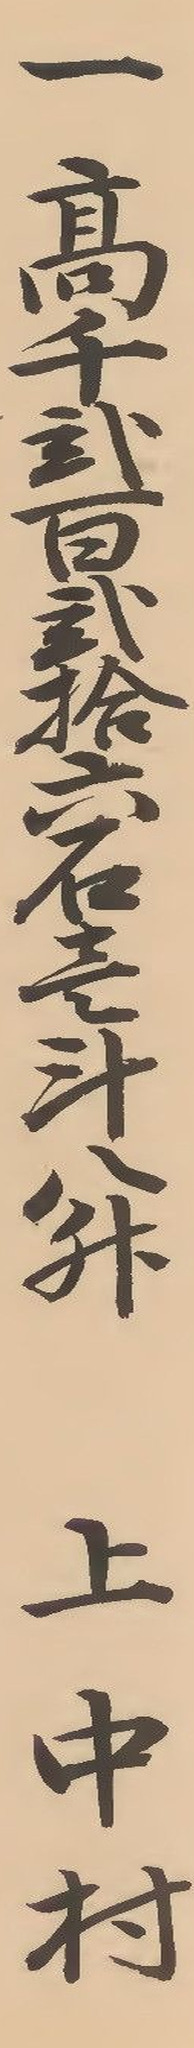一高千弐百弐拾六石壱斗八升上中村
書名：越前国郷帳
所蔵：国立公文書館 National Archives of Japan
